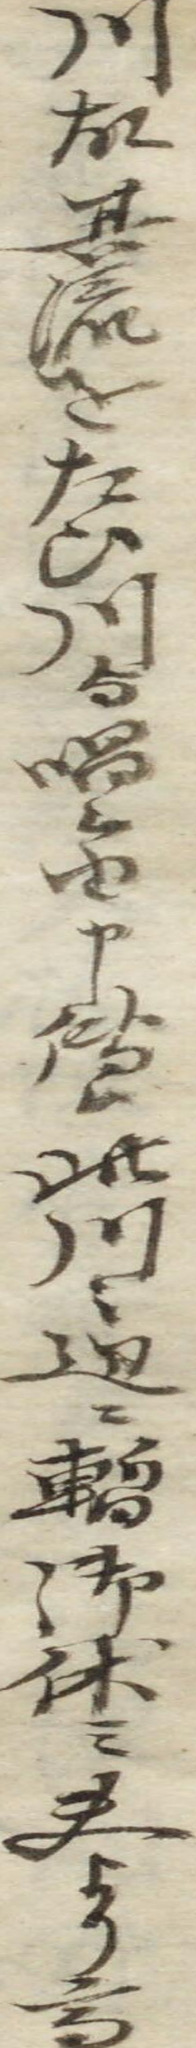川故其流をたひ川与唱候由申伝候此川之辺に暫御休み夫より高
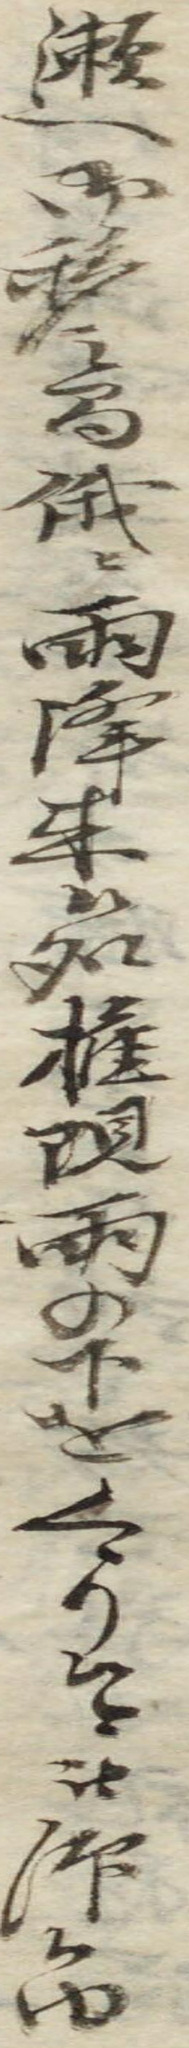瀬へ御移之間俄に雨降来候処権現雨の下をくゝり候と被仰候由
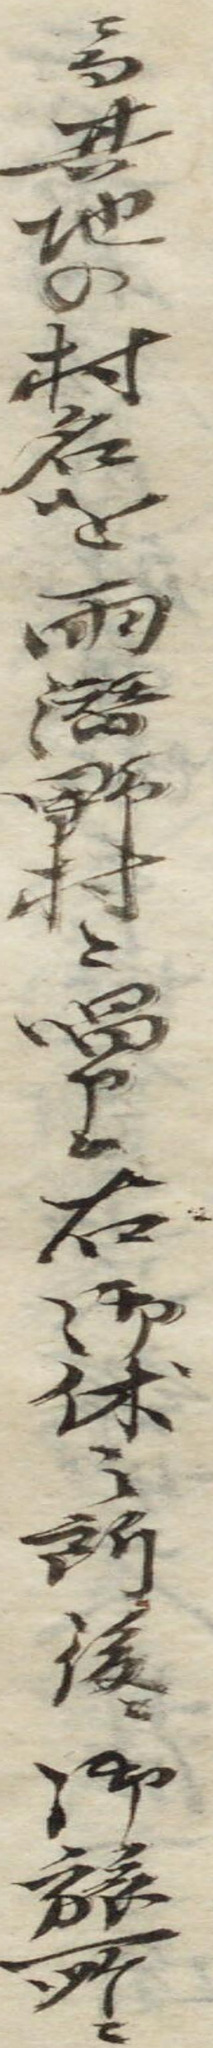に而其地の村名を雨潜野村と唱申候右御休之所後に御旅所に
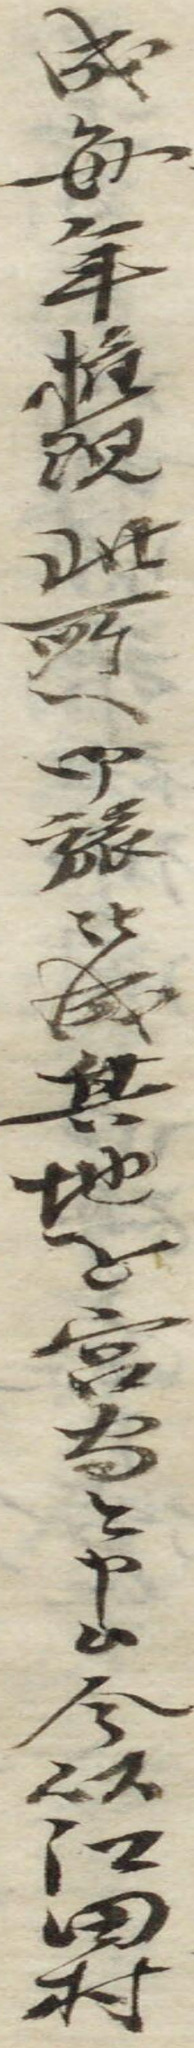成毎年権現此所へ御旅被成其地を宮守と申候今以江田村
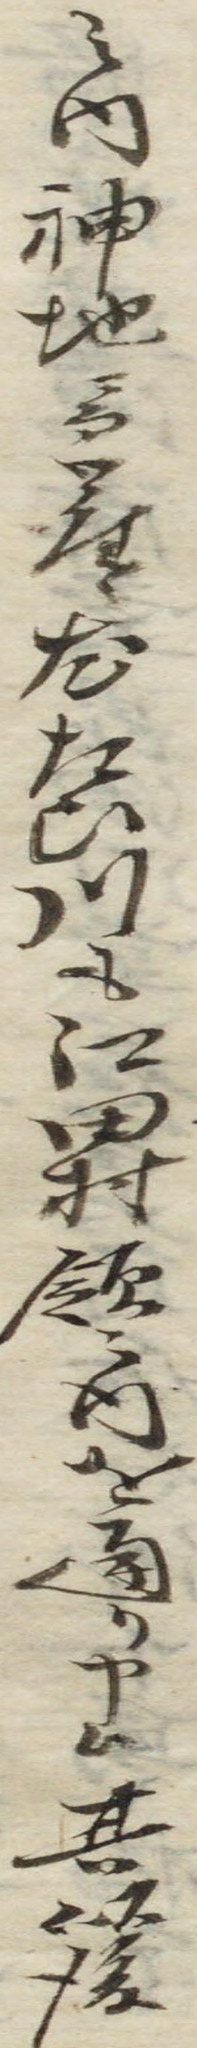之内神地に而御座候尤たひ川も江田村領之内を通り申候其以後
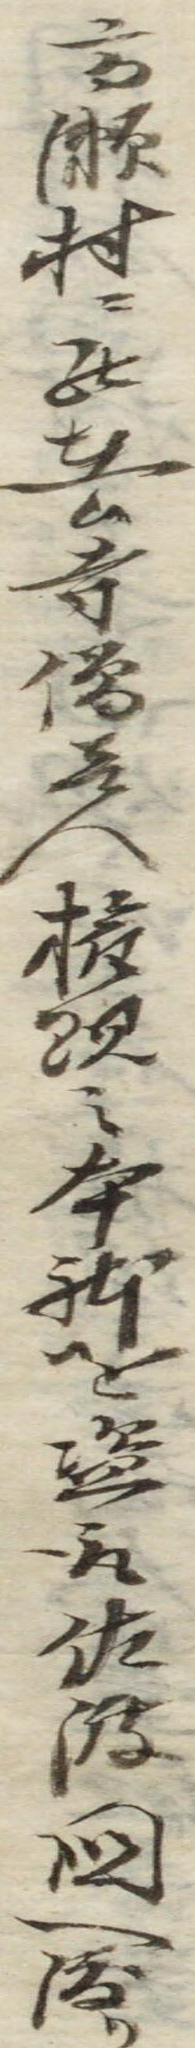高瀬村に罷在候寺僧壱人権現之本躰を盗取佐渡国へ渡り
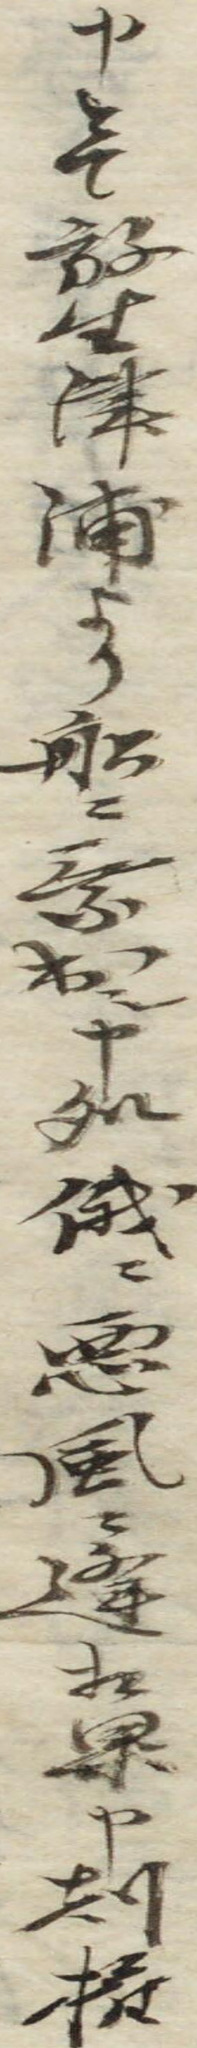申とて放生津浦より船に乗出し申処俄に悪風に逢相果申刻権
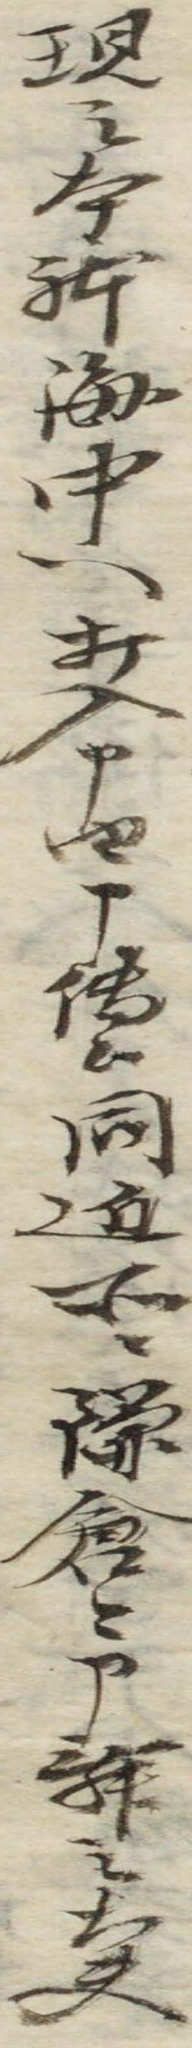現之本躰海中へ打入申由申伝候同近所に鎌倉と申舞之大夫
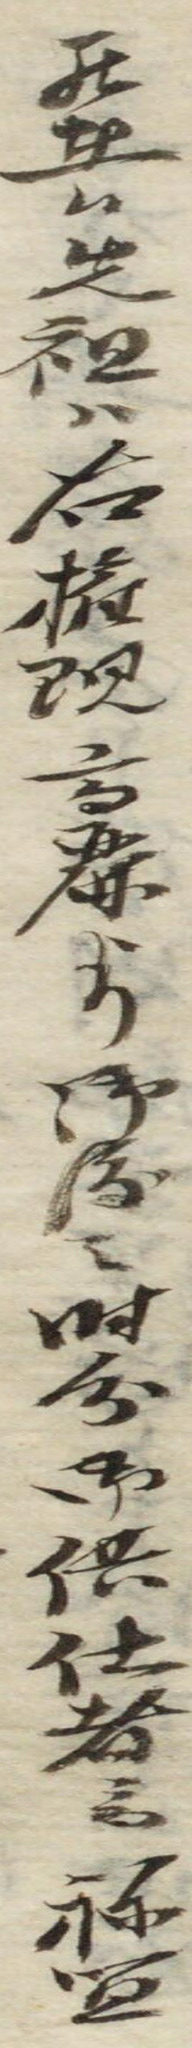罷在候先祖は右権現高麗より御渡之時分御供仕者に而祢宜
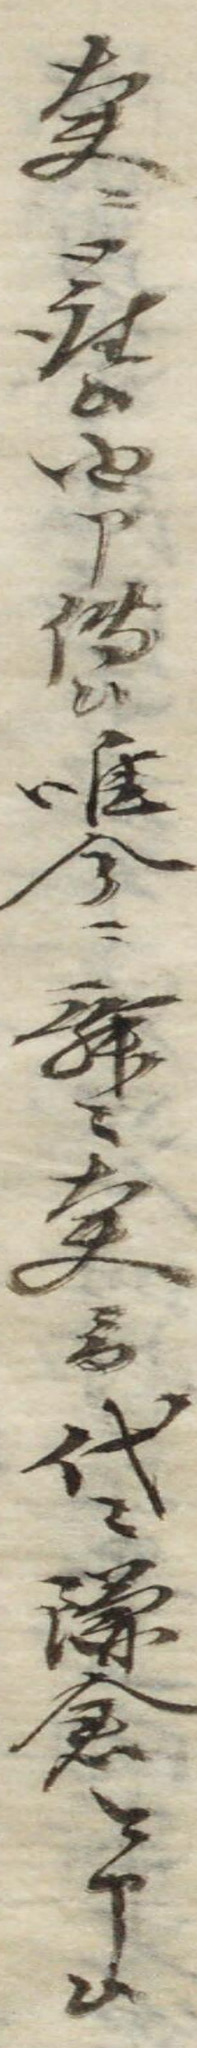大夫に御座候由申伝候唯今に舞之大夫に而代々鎌倉と申候
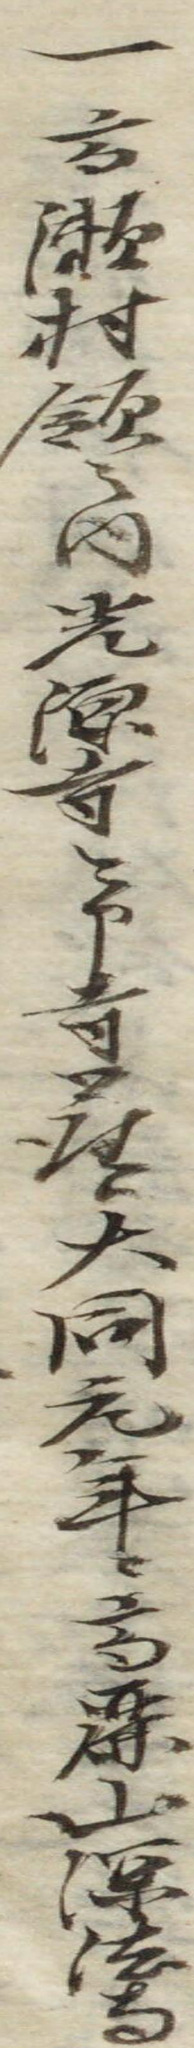一高瀬村領之内光源寺と申寺御座候大同元年に高麗山深法寺
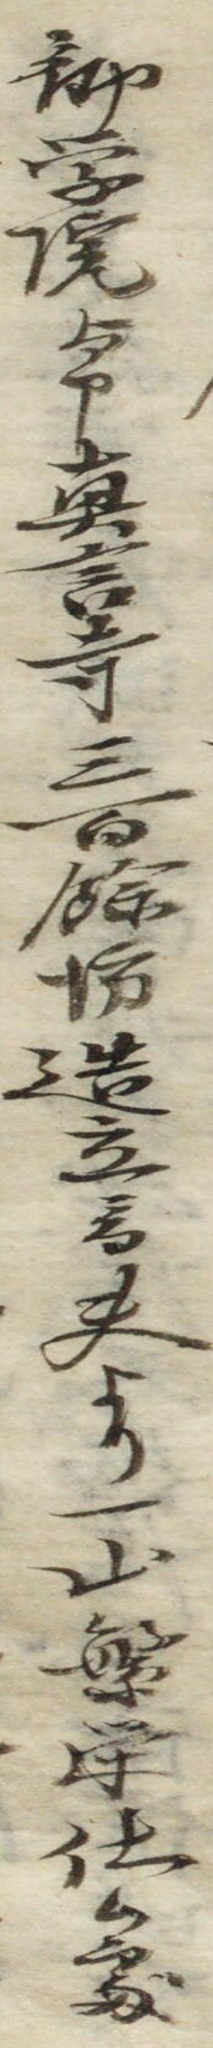勧学院与申真言寺三百余坊造立に而夫より一山繁栄仕候処
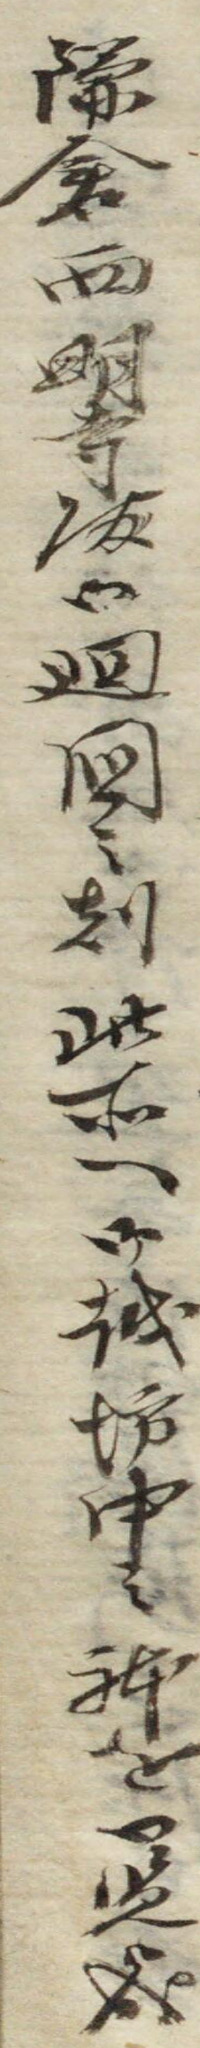鎌倉西明寺殿御廻国之刻此所へ御越坊中之躰を御覧被成

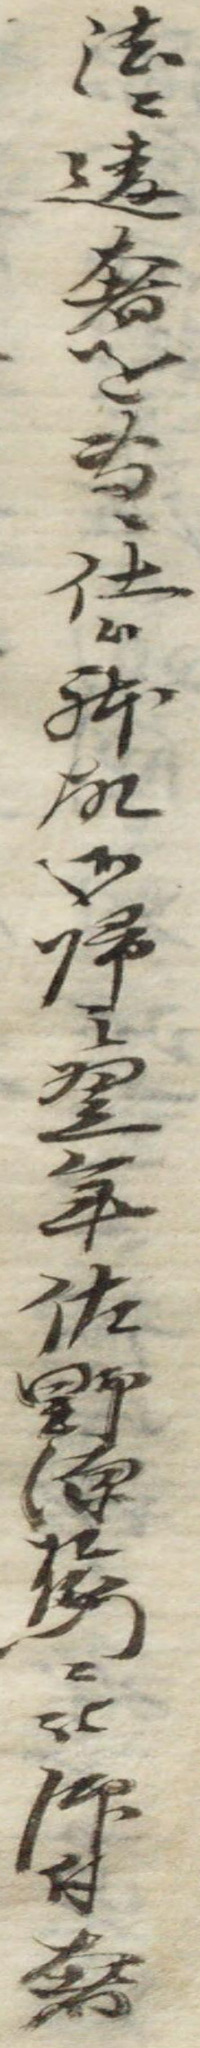法に違奢を為仕候躰故御帰之翌年佐野源左衛門に被仰付奢
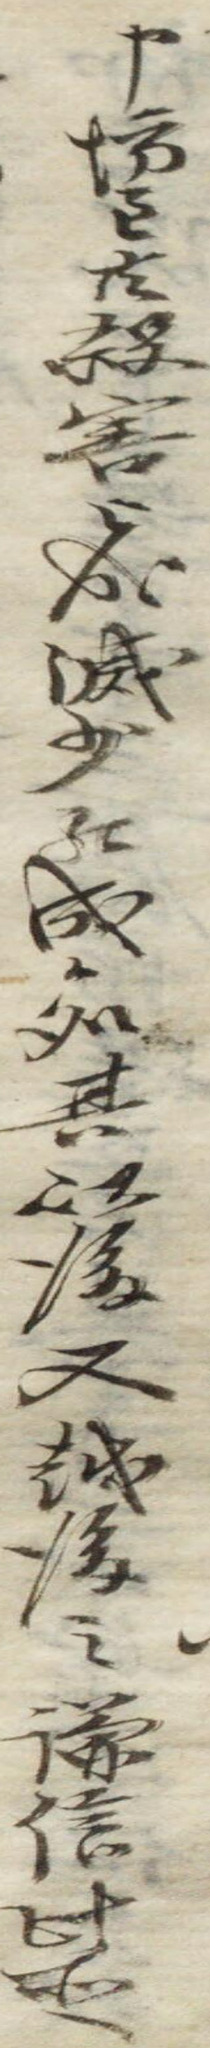申坊主共殺害被成減少罷成候処其以後又越後之謙信此所へ
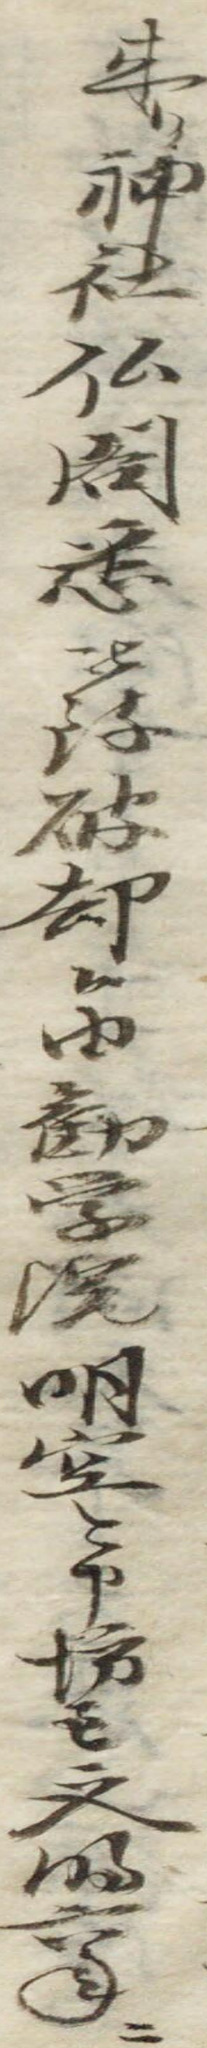来り神社仏閣悉被致破却候由勧学院明空と申坊主も文明六年に
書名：加越能旧聞録
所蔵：Ishikawa Prefectural Library
